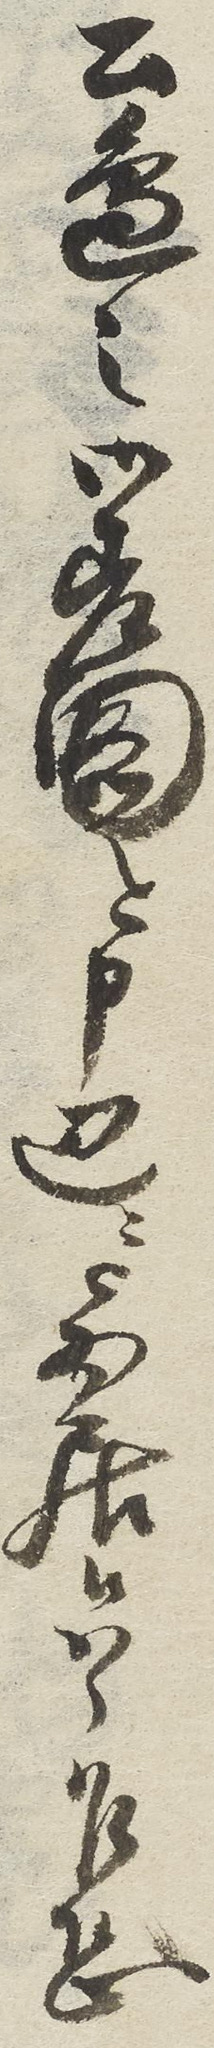公辺之御差図と申辺二被為居候ハゝ乍恐
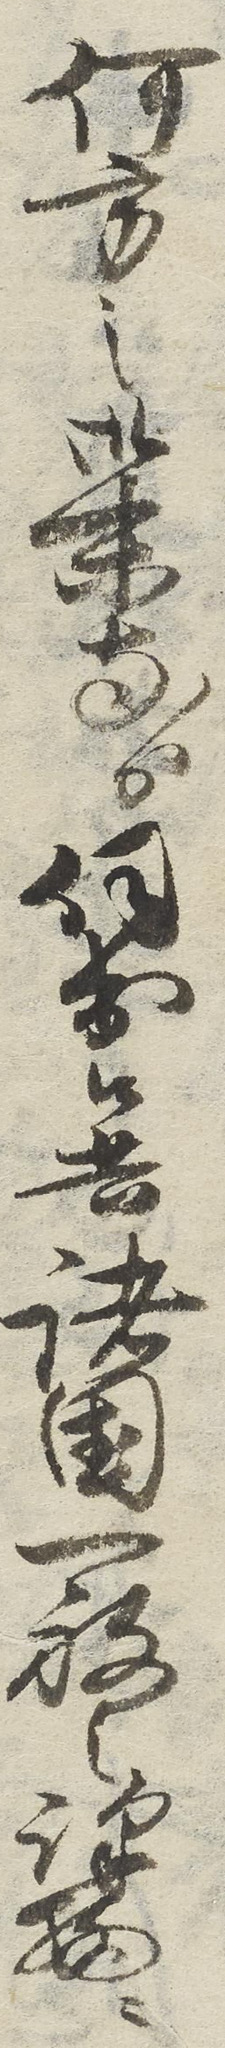何方之御末寺ゟ伺出候共諸国一般之譯柄二
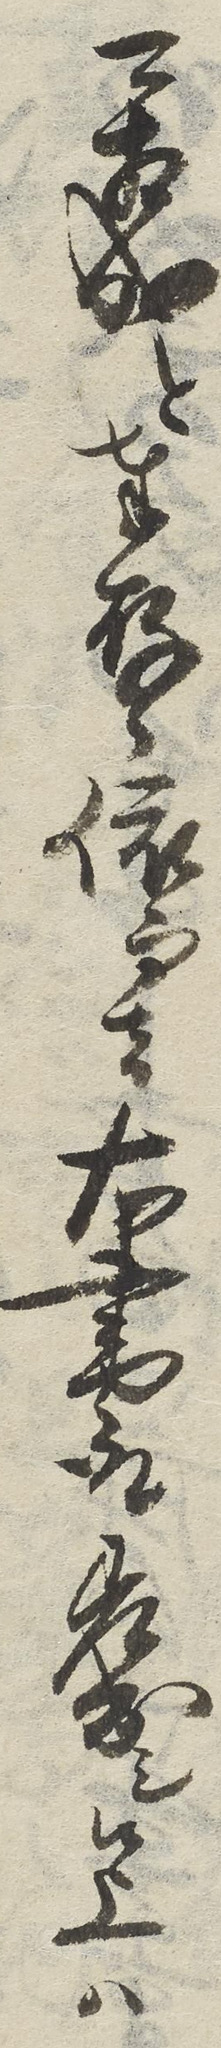可相成と奉存候依而は右書取差出ㇱ候上ハ
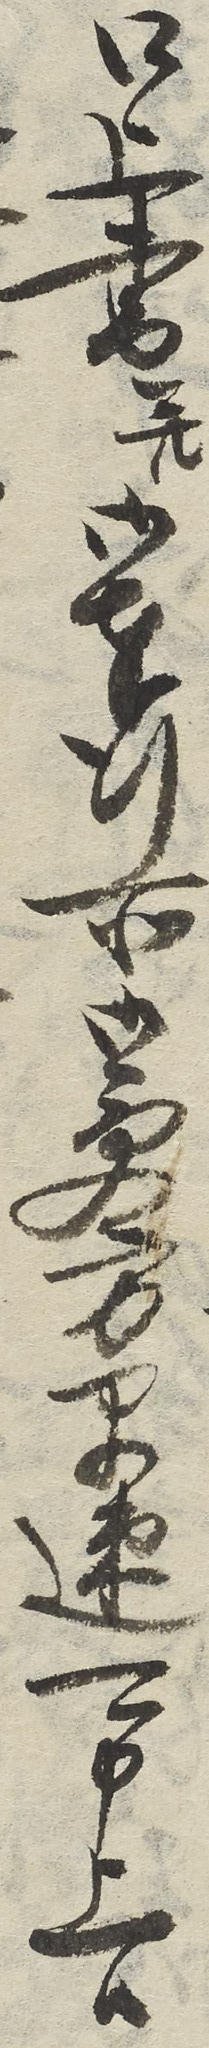口上書并御奉行所御受候間早速可申上候
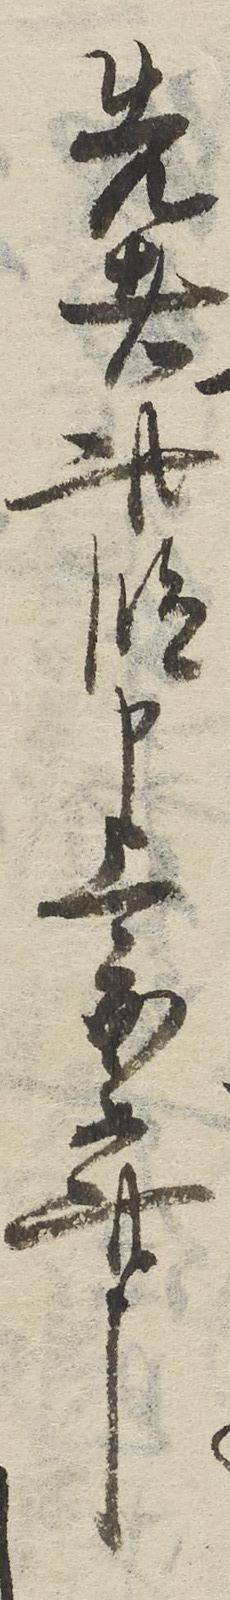先は此段申上度如此候

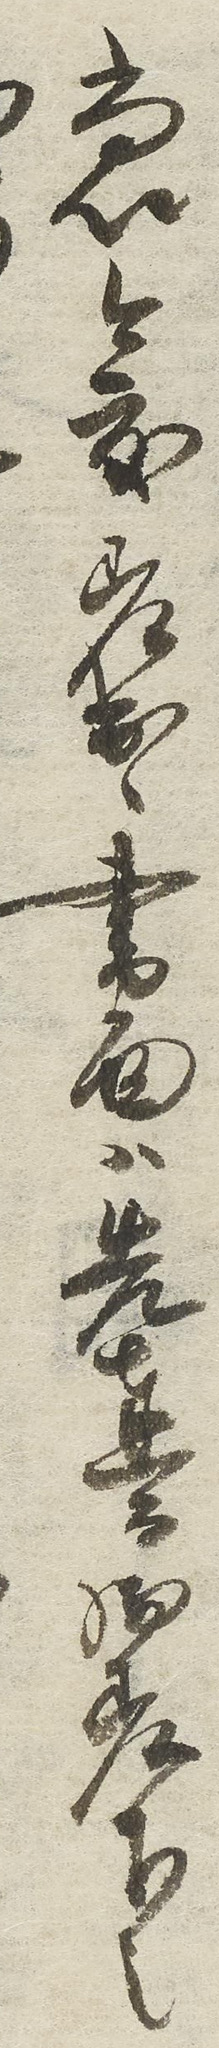尚以今度差出候書面ハ先達而御差下申候
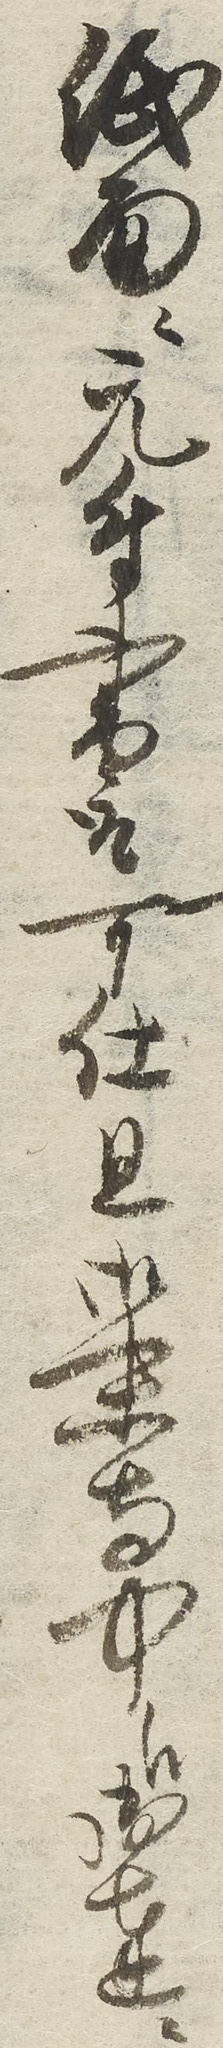紙面に元付書取可仕且御末寺中江御達二
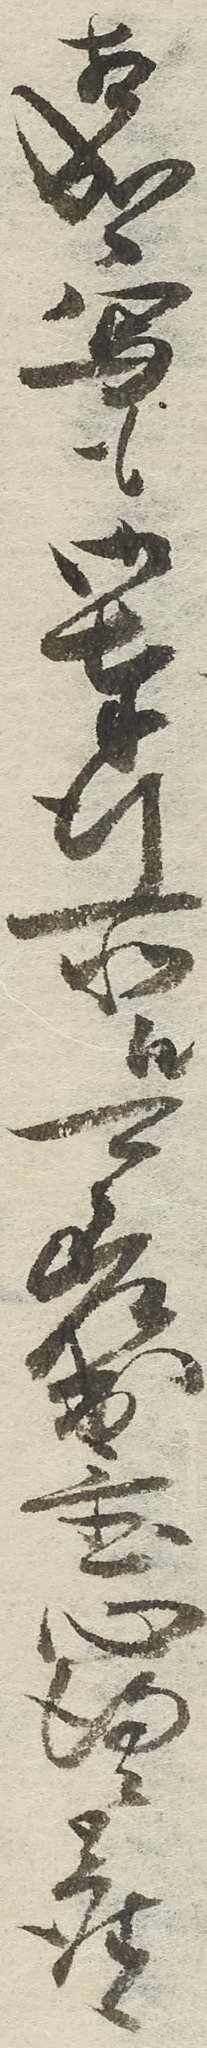相成候写も御奉行所江可差出置心得二御座候
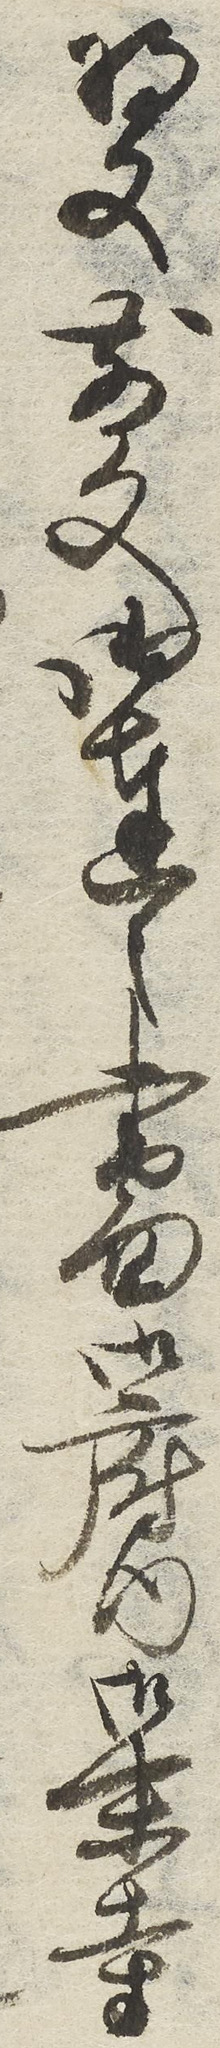将又前文御達之書面御府内御末寺
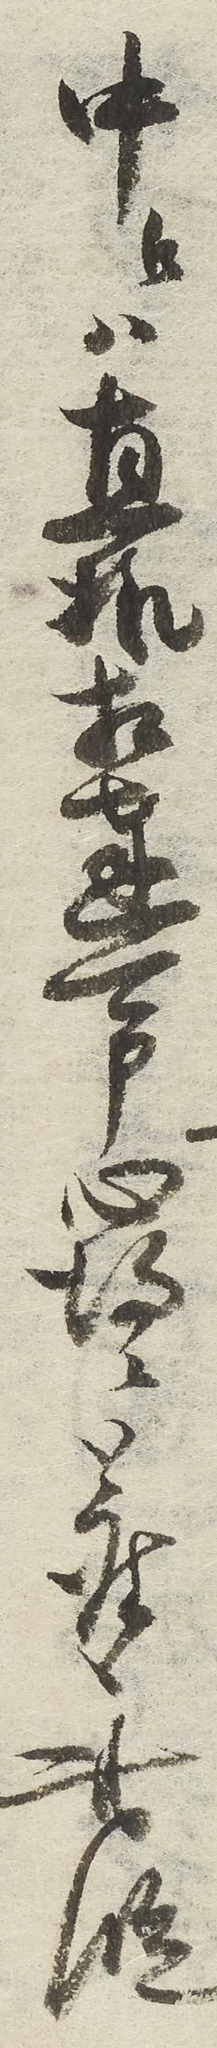中江ハ直様相達可申心得二御座候此段
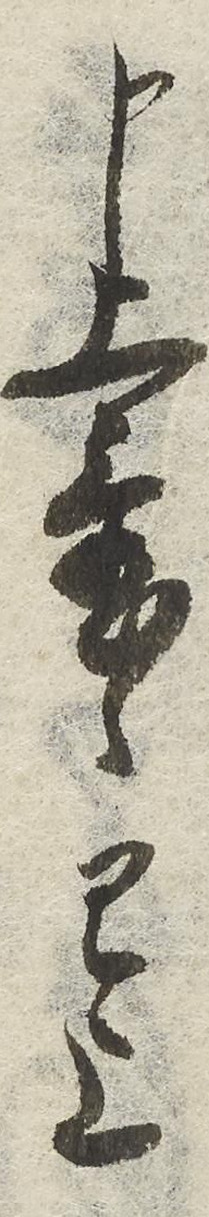申上置候已上
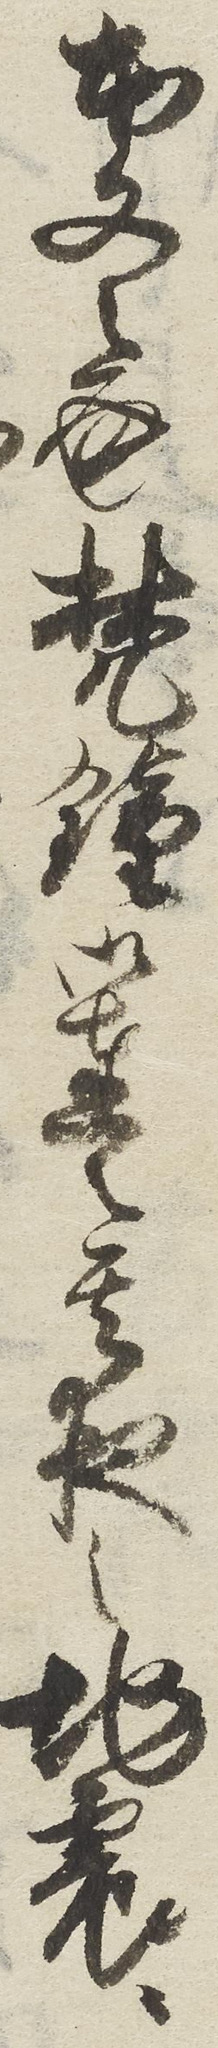前文之通梵鐘御達之其夜之地震二
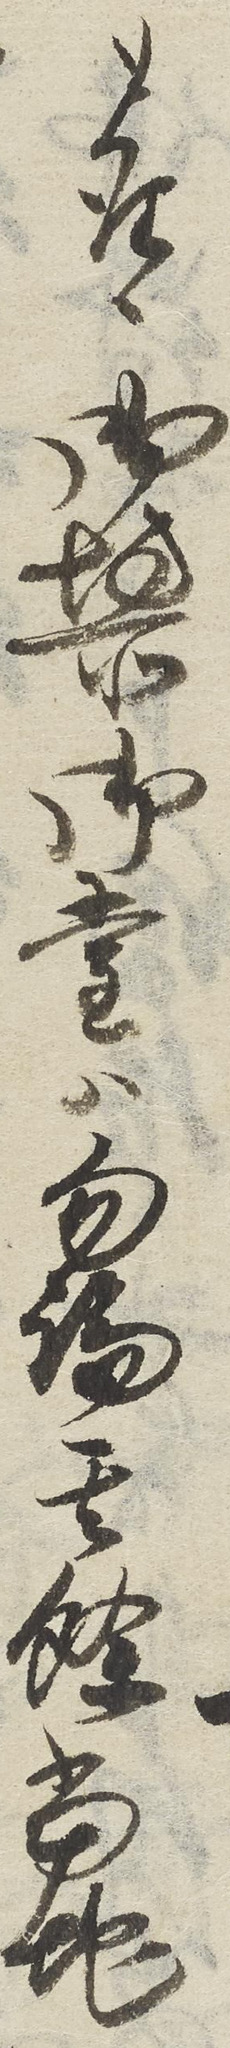御座候御坊所御堂は勿論其余当地
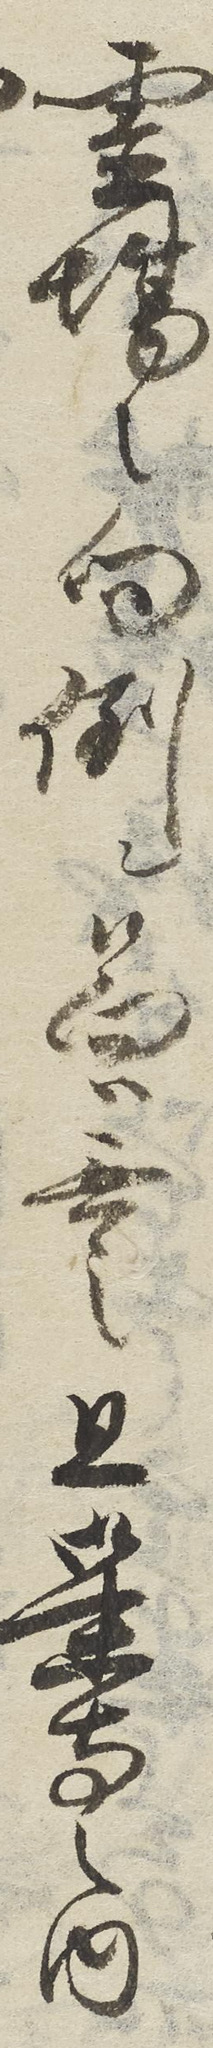霊場之向倒ㇾ候向ハ無之且御末寺之内
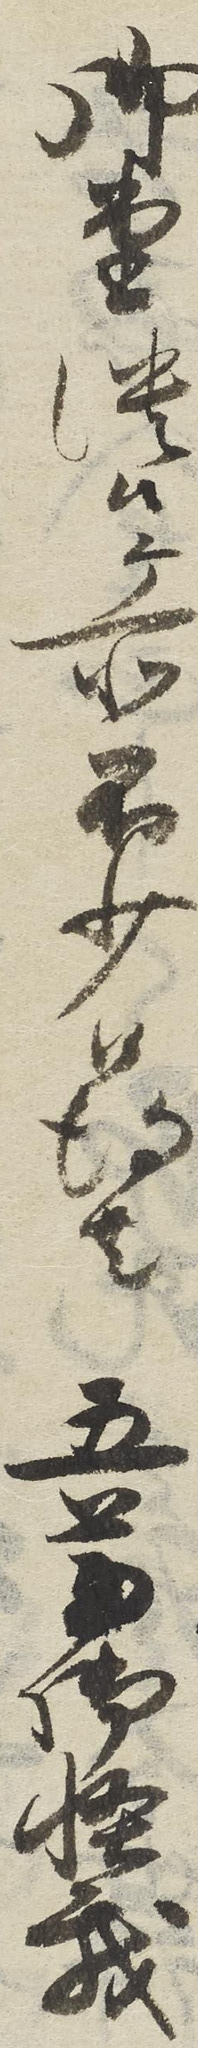御堂潰候ヶ所不少候得共五尊御怪我
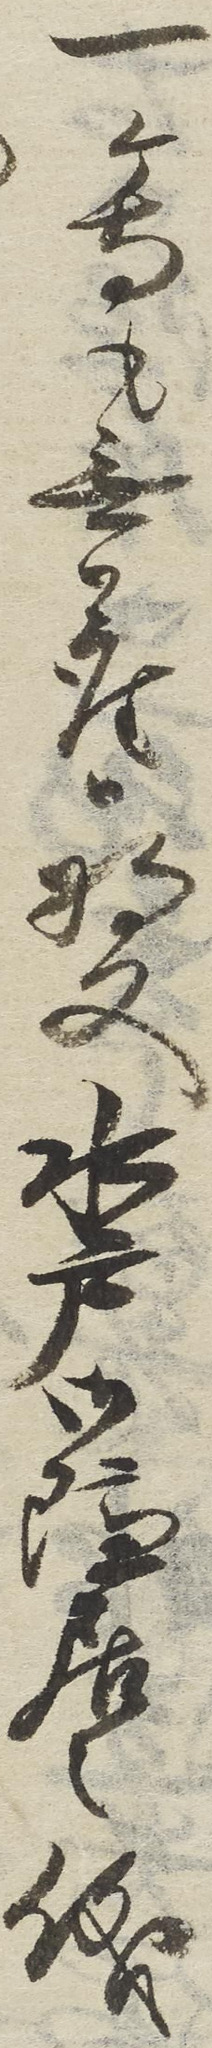一ヶ寺も無御座候将又水戸御隠居之儀
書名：[梵鐘差出一件]
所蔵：東京大学地震研究所図書室 Earthquake Research Institute Library, The University of Tokyo, JAPAN
